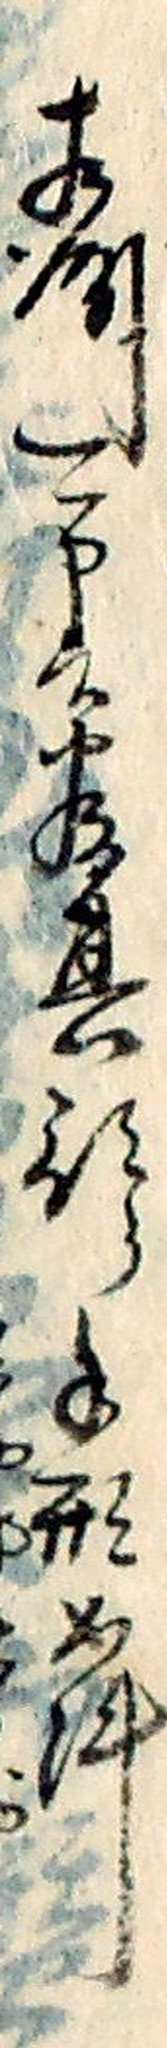相渡し可申候為其預り手形如件
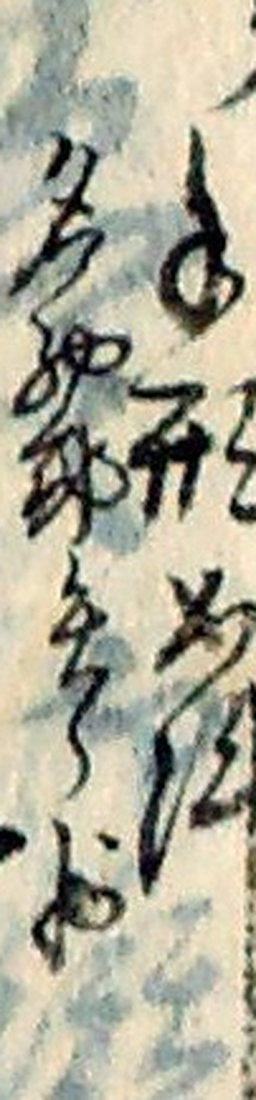名西郡矢ノ村
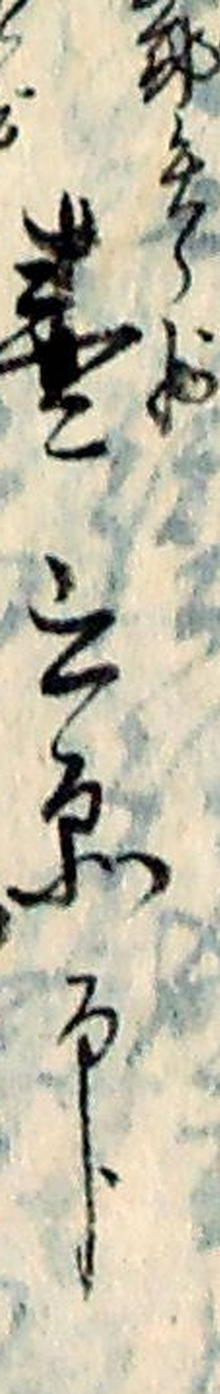盛六兵衛印
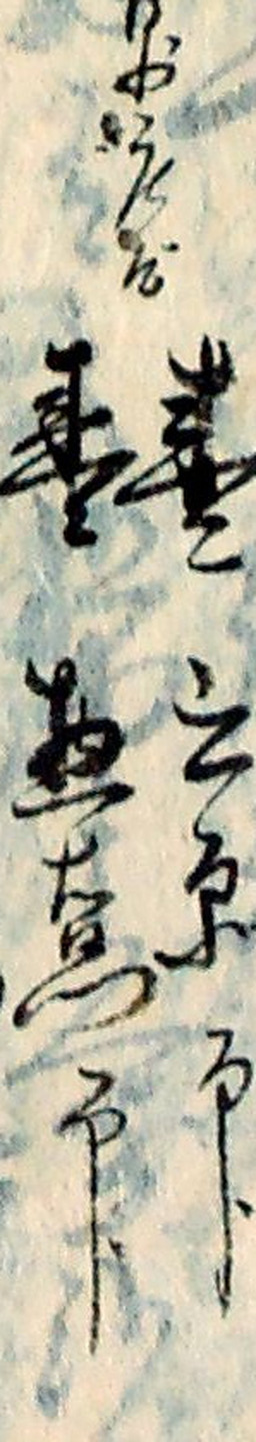盛惣右衛門印
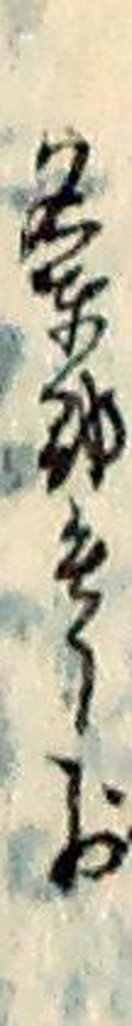名西郡矢ノ村
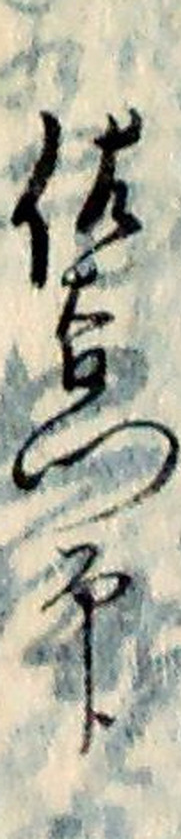井右衛門印
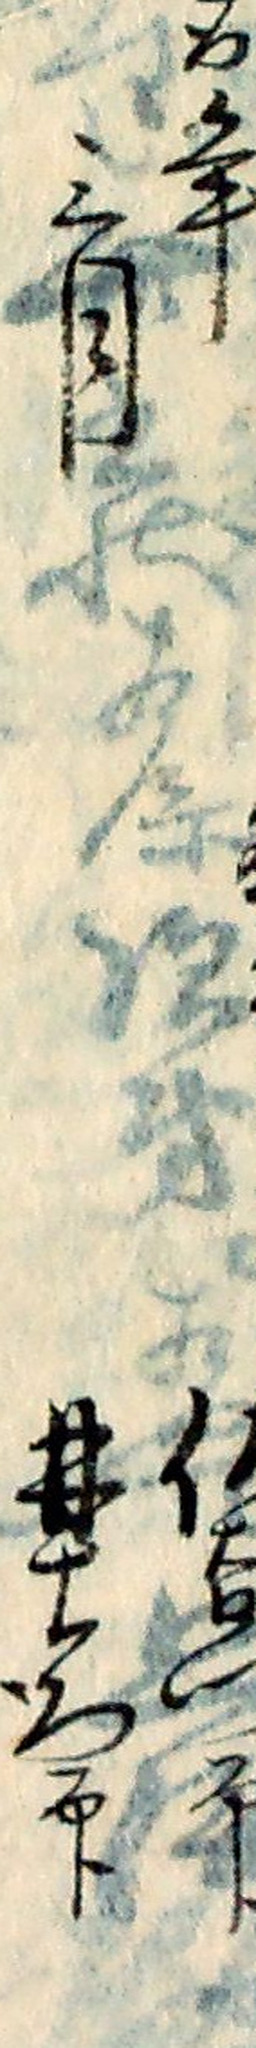三月佐右衛門印
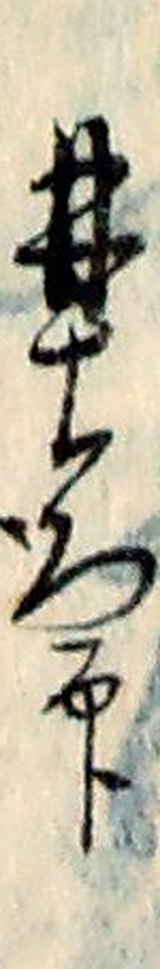井右衛門印
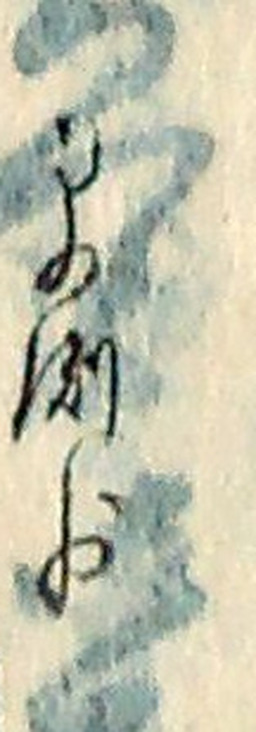早淵村
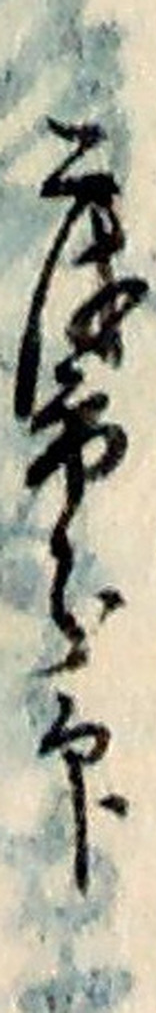茂市郎印
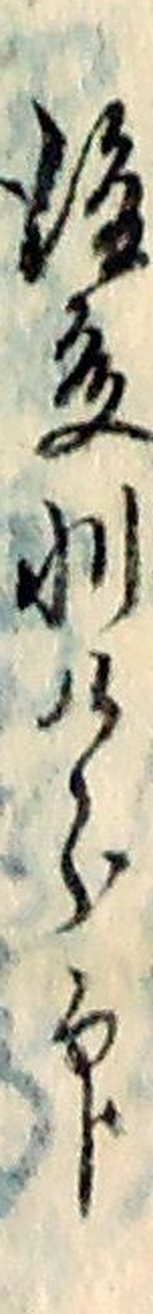後藤利八郎印
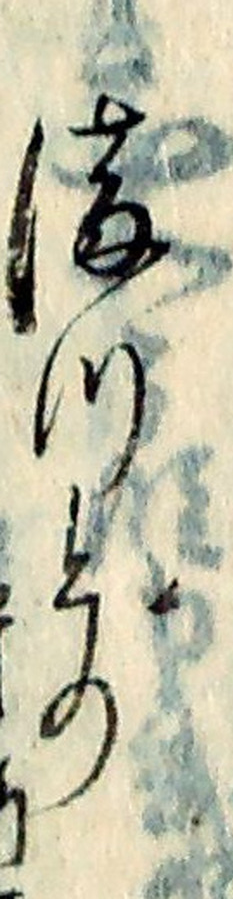満川との
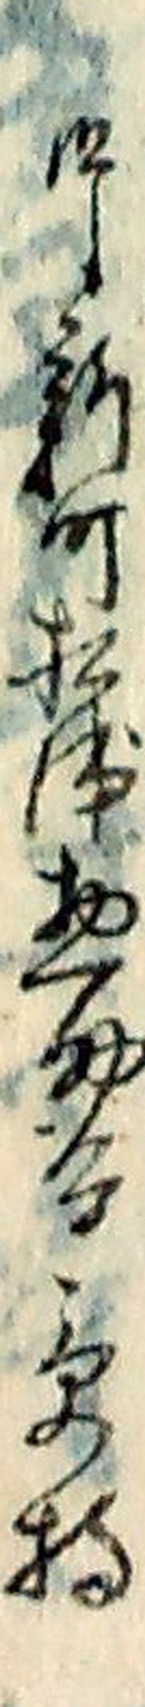但し新町松浦惣助殿受持
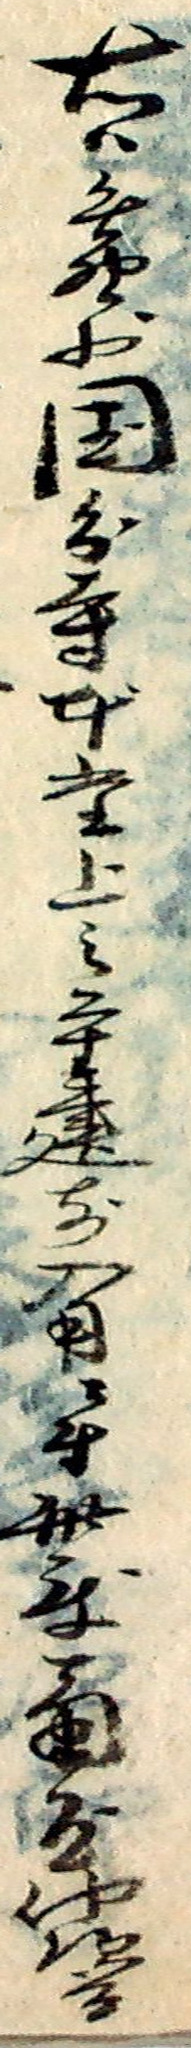右は矢野村国分寺本堂上之堂建前入用に付此度菊屋仲次殿
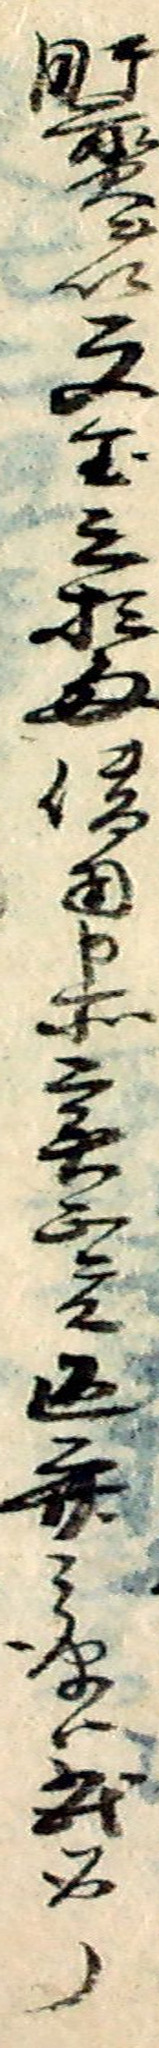肝煎を以文金三拾両借用申所実正に候返弁之儀は当酉の
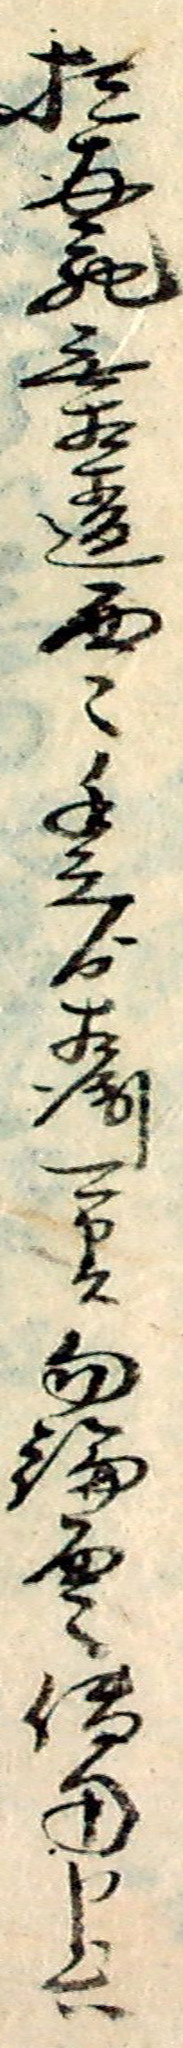拾両宛無相違面々手元ゟ相渡し可申候勿論面々借用申上は
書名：諸御願書控(後藤氏壱番）
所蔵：鳴門教育大学 Naruto University of Education
